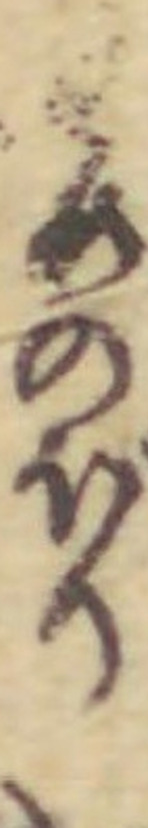せめのぼり
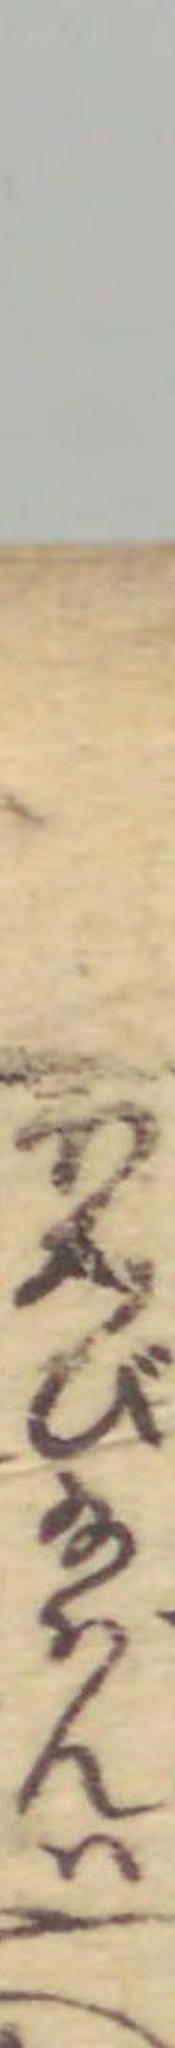ほろび給はんは
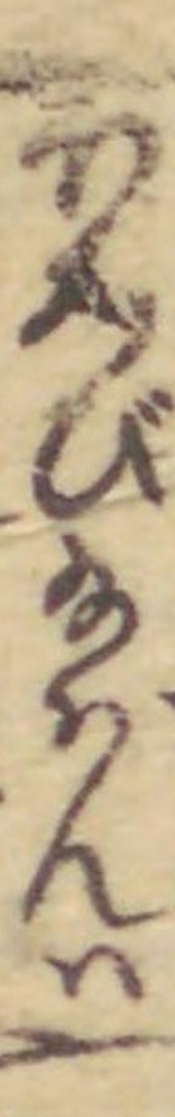ほろび給はんは
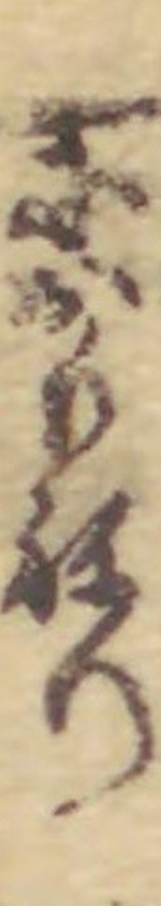におもねり
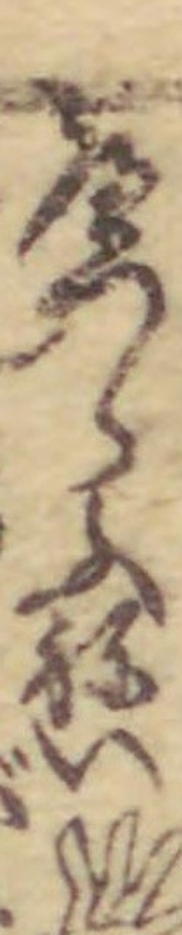へつらふねい
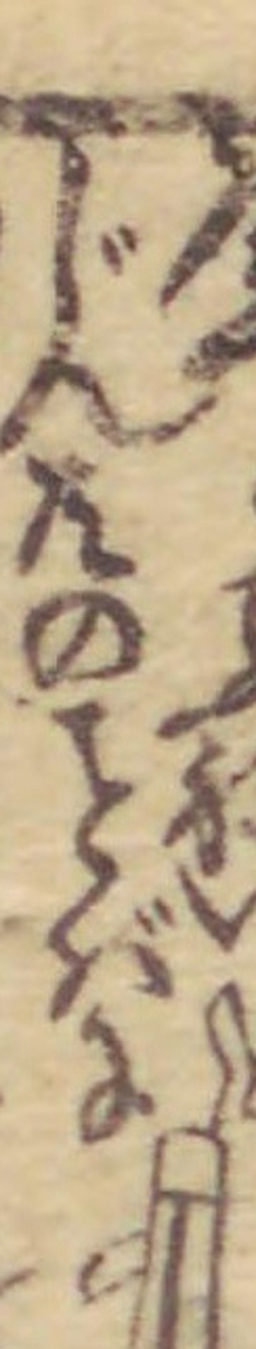じん共のことばに
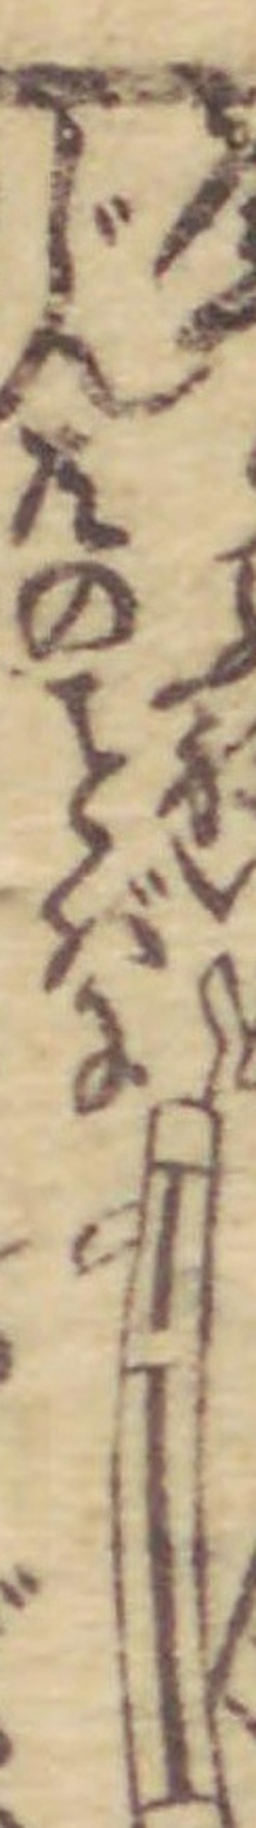じん共のことばに
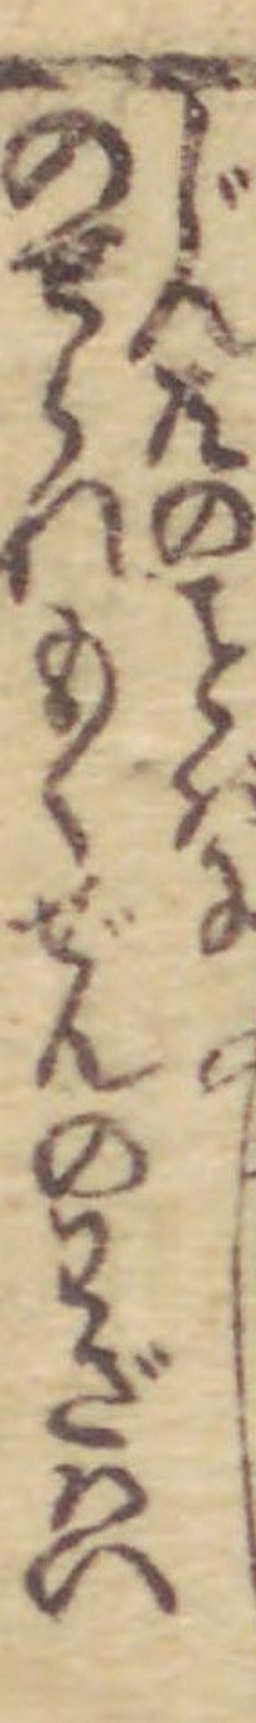のせられもくぜんのわざはい
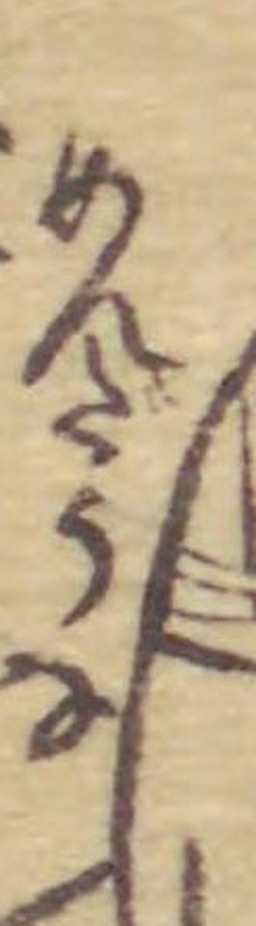めんだうな
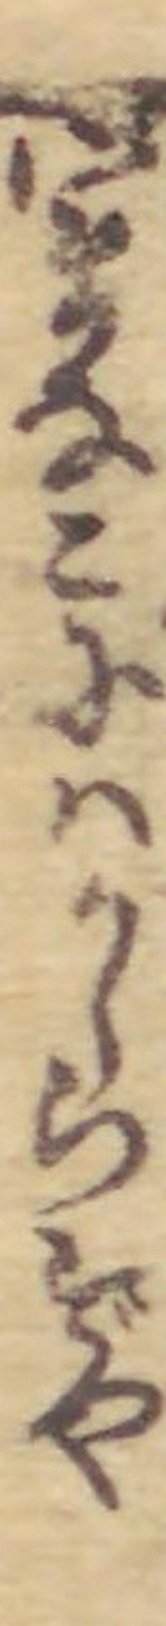御まなこにはかしらぞや
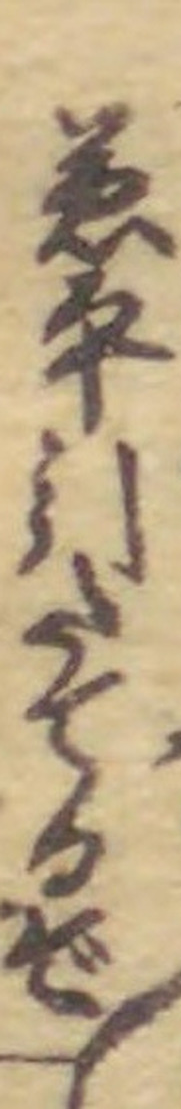兼平引きたてるぞ
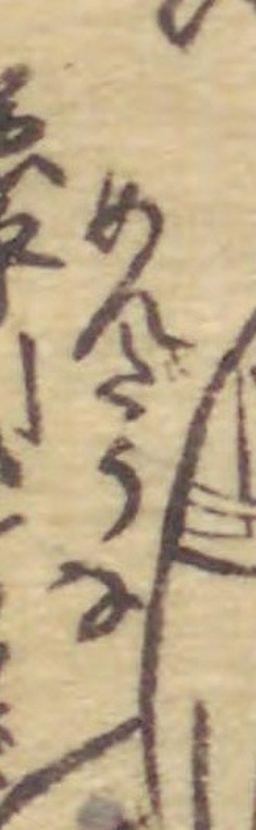めんだうな

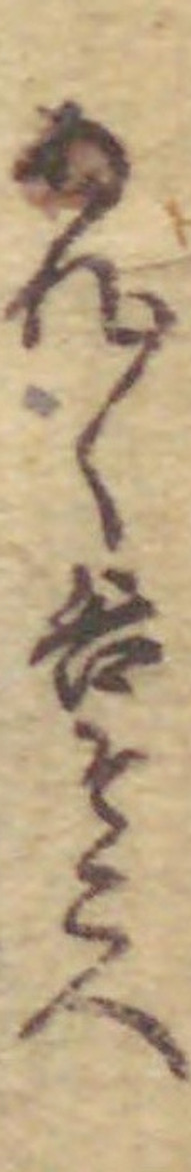あれ〳〵谷そこへ
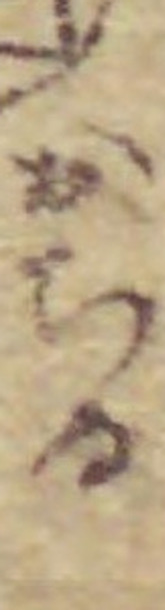おちる
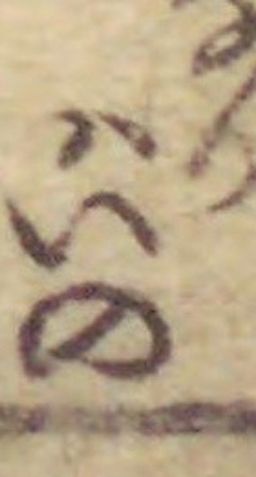はいの
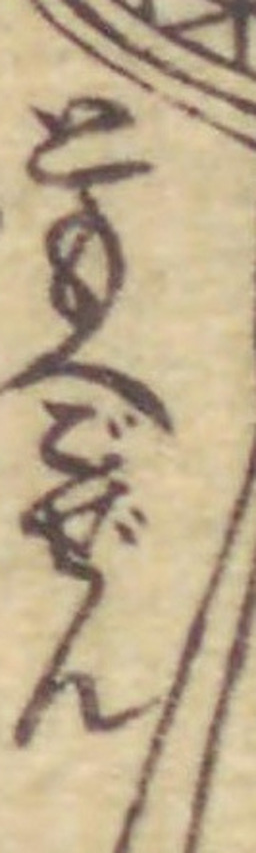ともへごぜん
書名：朝比奈草摺実記 2巻
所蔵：国立国会図書館 National Diet Library, JAPAN
